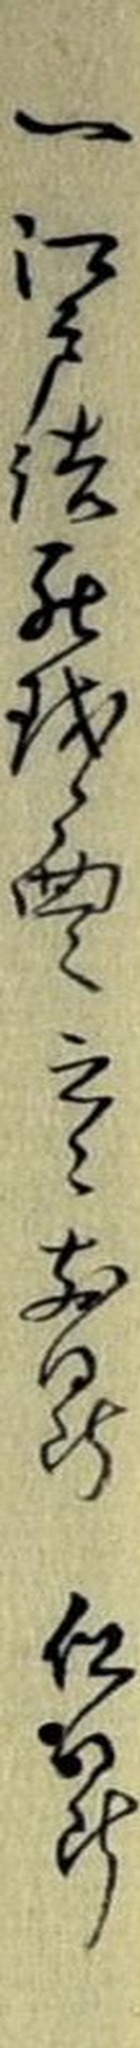一江戸詰罷越候面々云々前同断但同断
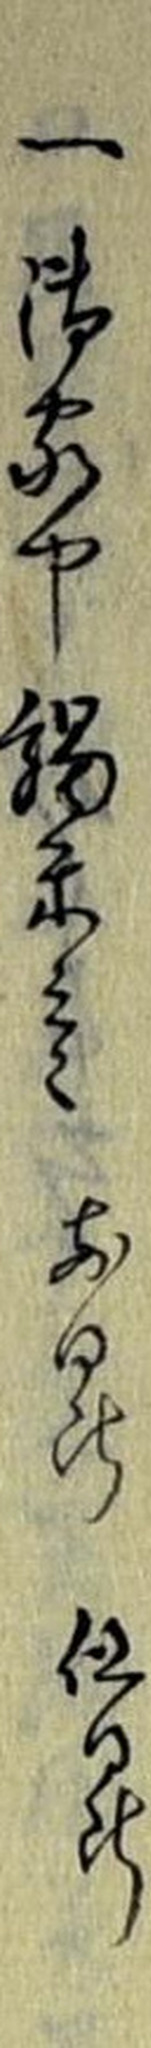一御家中餲米云々前同断但同断
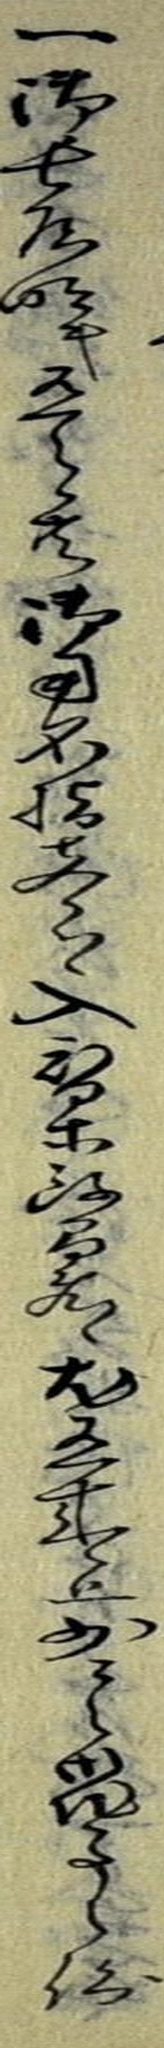一御長屋明き有之候共御用不指支候はゝ入替等致間敷候尤有来候上少々之御作事之儀
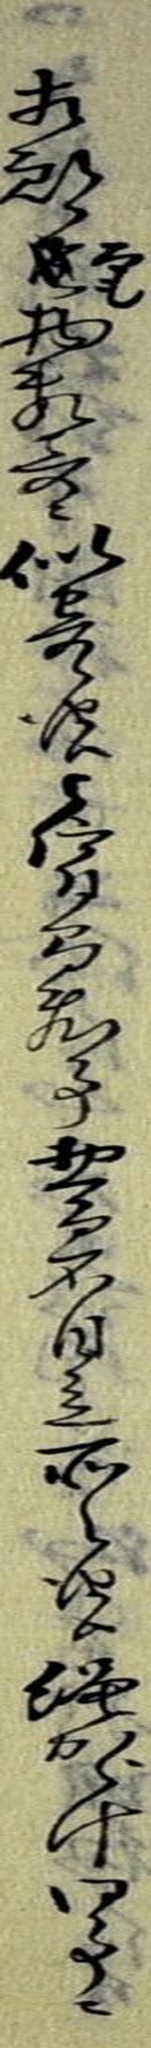相願候而も物数寄に似寄候儀は被仰付間敷事惣而不目立所之儀は縄からけ同事に
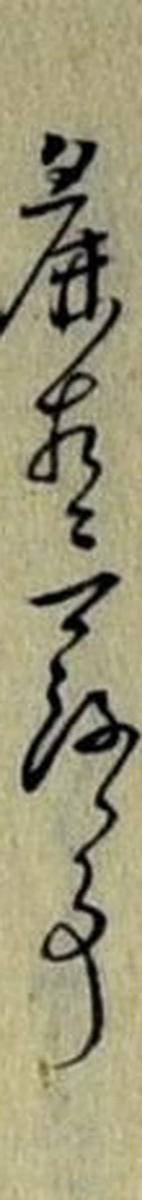麁相に可致候事
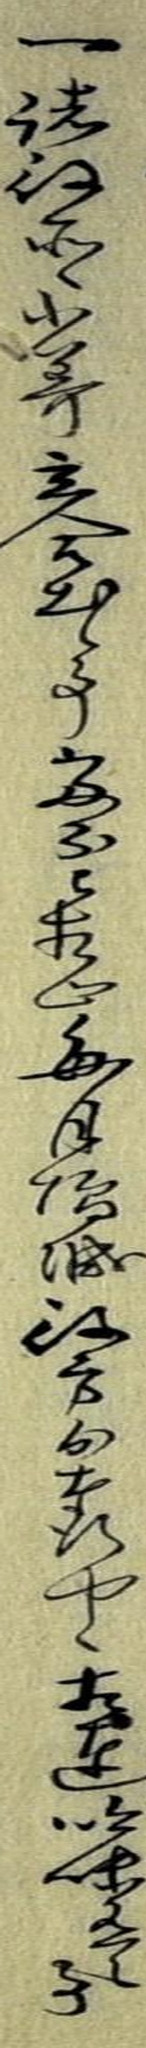一諸役所へ少算立合出候事当分被相止毎月増減役方ゟ奉行中へ相達吟味有之事
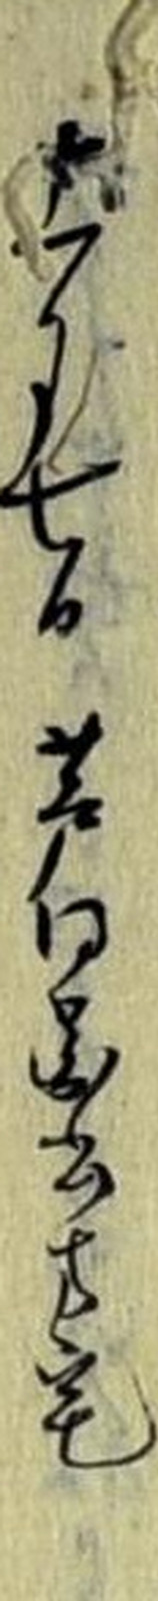十一月七日芦田図書方宅
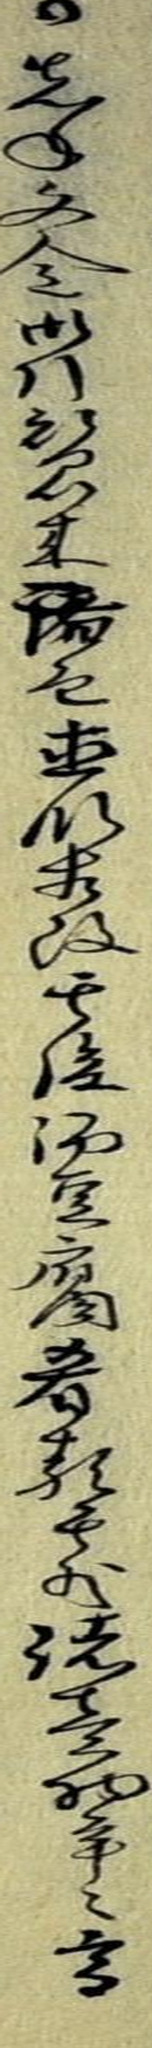〇先年文金御引替以来諸色直段相改其後酒豆腐肴類其外諸売物年々高
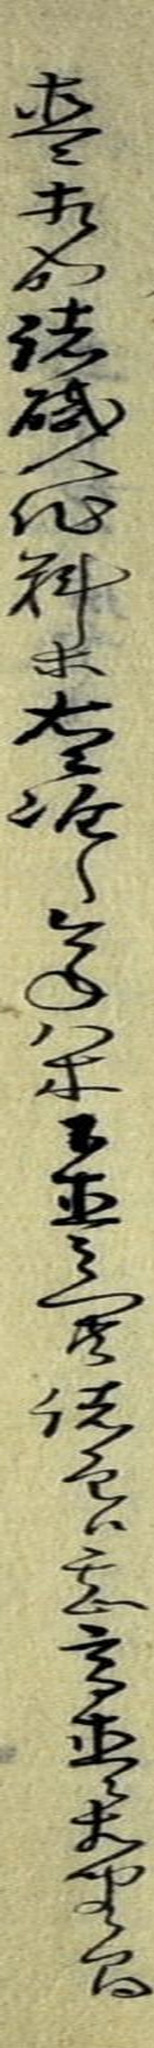直に相成諸職人作料等右に准し今年米下直に候へ共諸色は甚高直に相聞候間
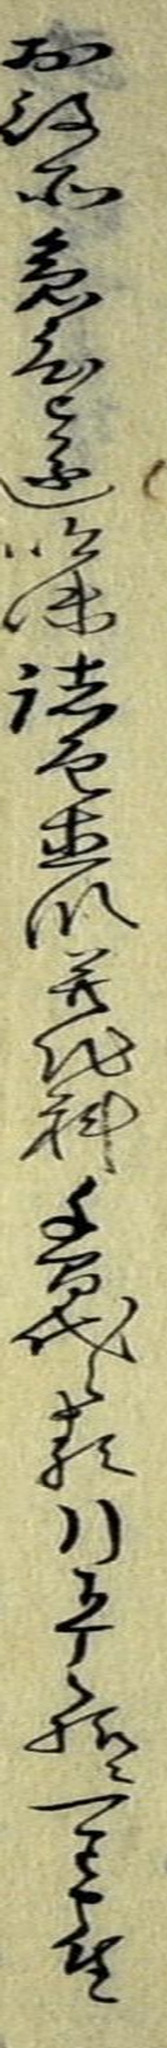於役所急度被遂吟味諸色直段并作料手間代之類引下ヶ候様に可被申付候
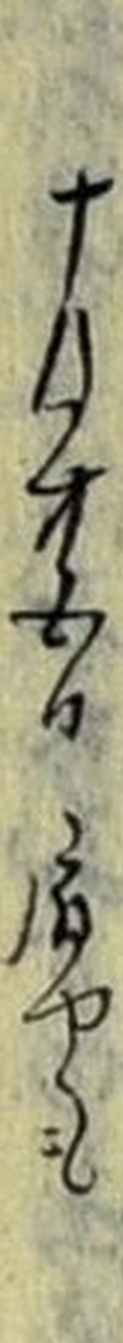十月廿五日府中へも
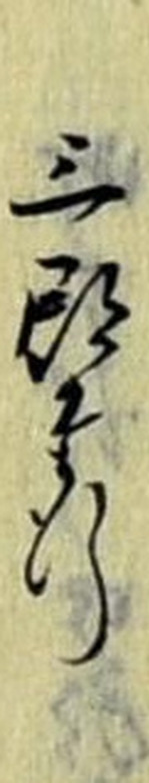三郡奉行
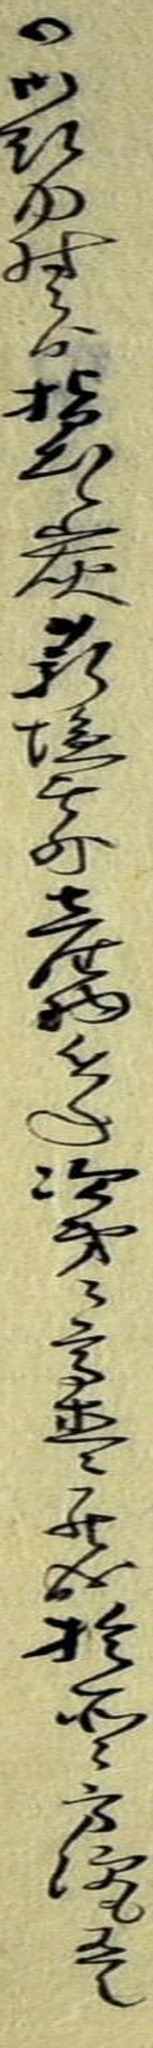〇御領内村々ゟ指出候炭薪塩其外産物近年次第に高直に罷成於所々方便も有之
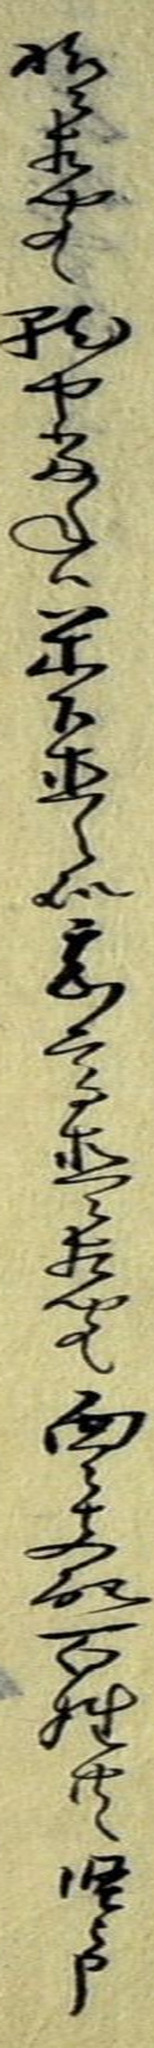様に相聞候就中当年は米下直之処甚高直に相聞候面々支配百姓共へ堅被申

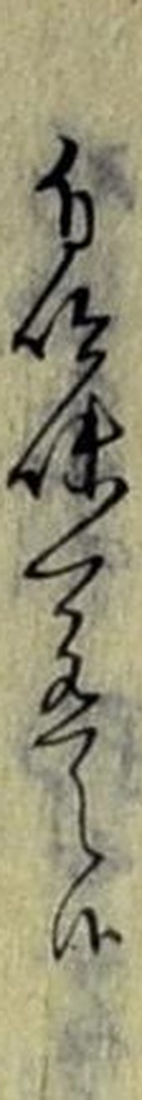付吟味可有之候
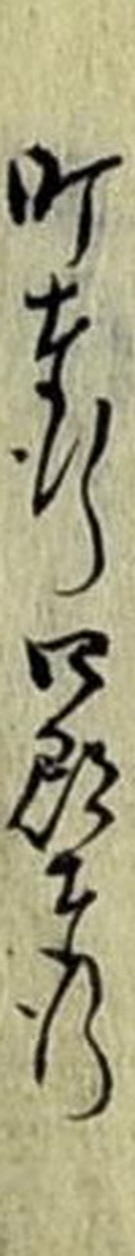町奉行四郡奉行
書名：命令之部 二
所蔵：福井県文書館 Fukui Prefectural Archives
